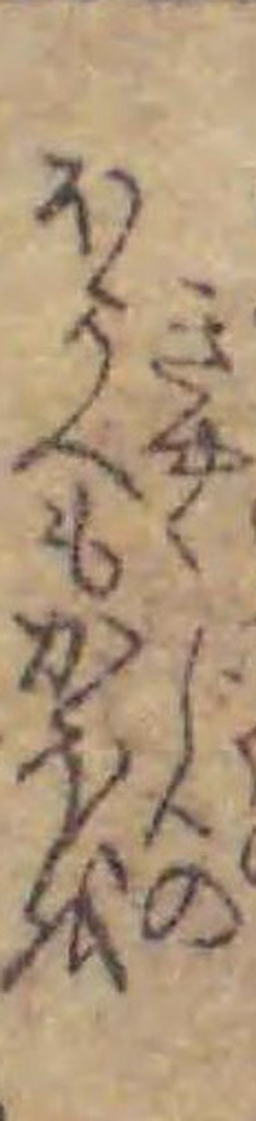ほうへもかほを
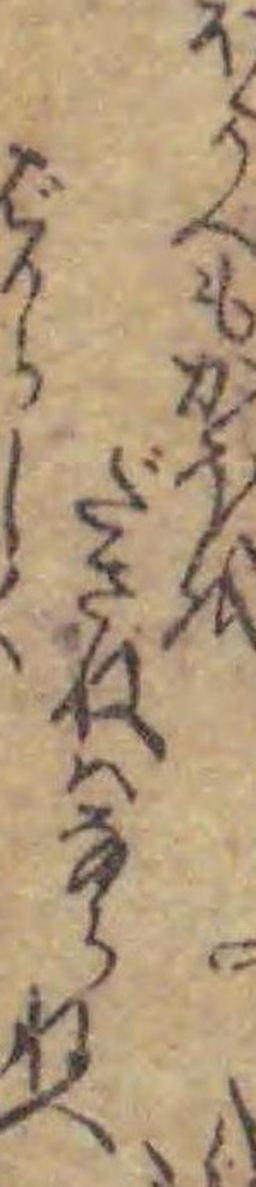ばからしく
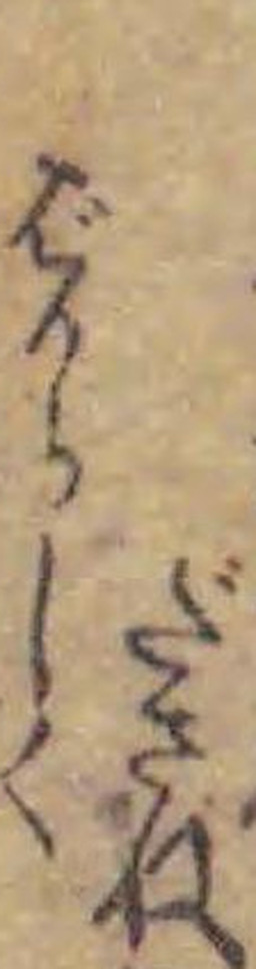ばからしく
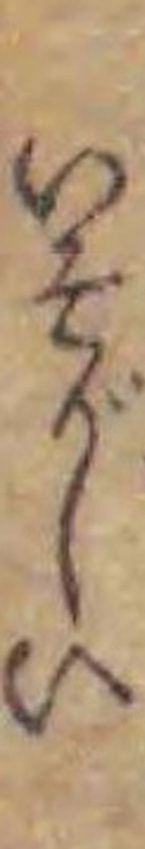いそがしい

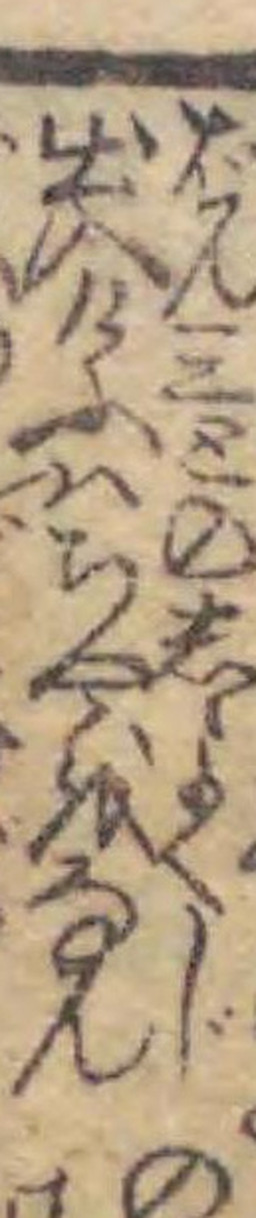出入けふはちやをなん
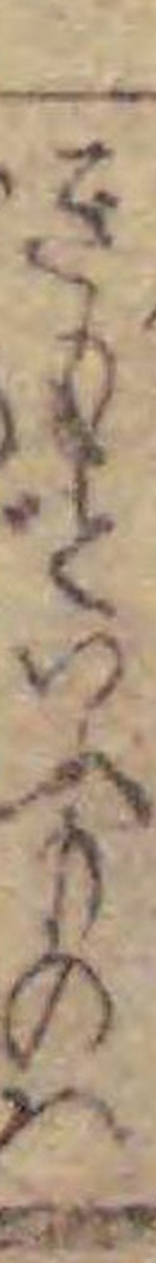きもといふものは
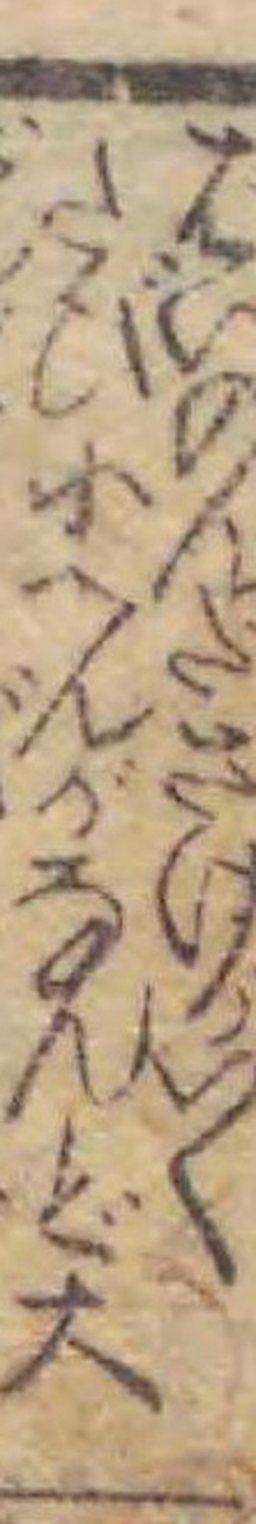たび小へんがなんど大
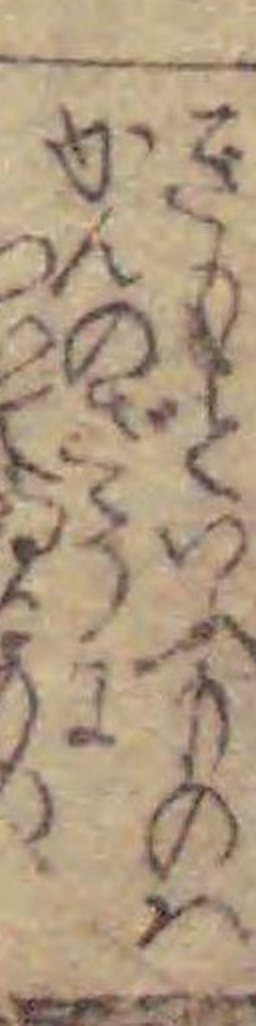かんのざうに
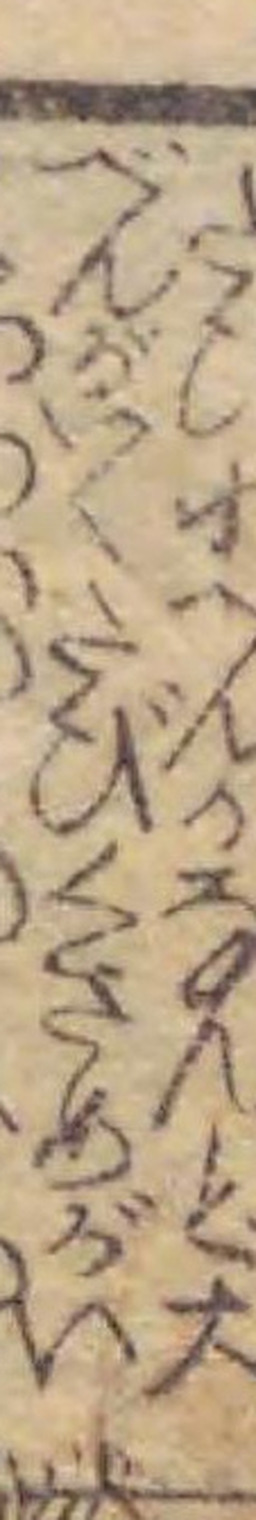べんがいくたびくさめがい
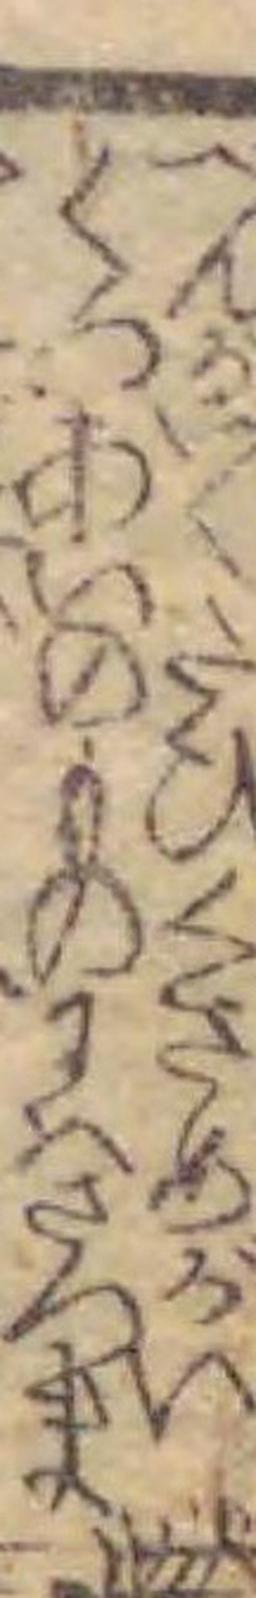くつあいのものにはさつま
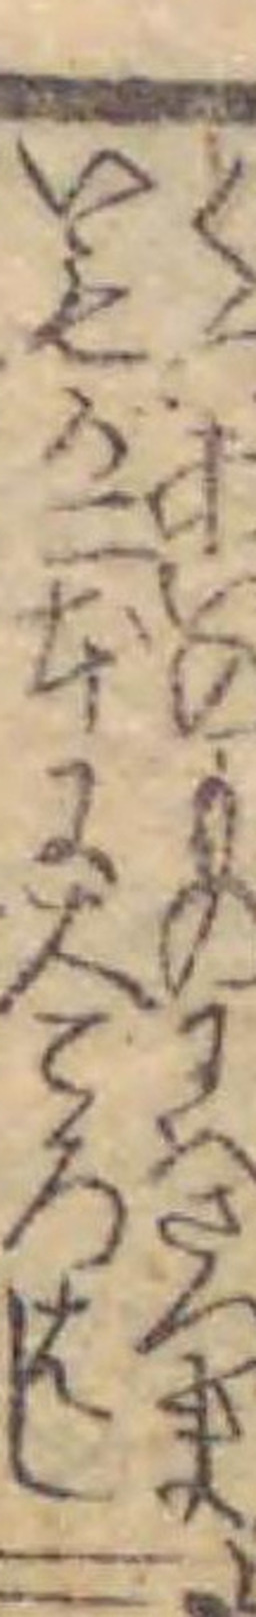いもが二本に大ころはし
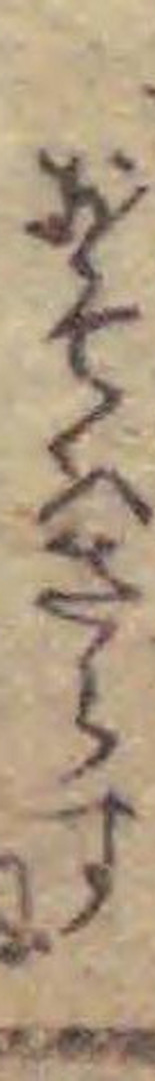おそはさらす
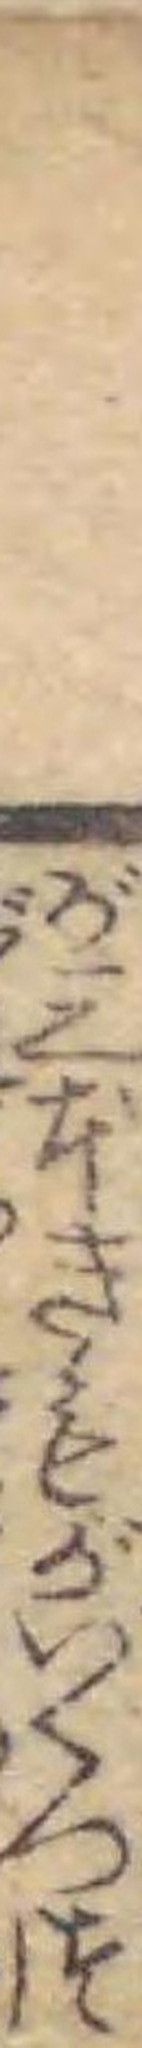が三本きもがいくつつ
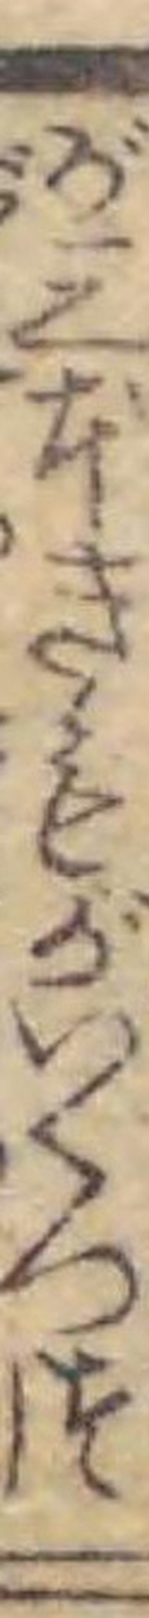が三本きもがいくつつ
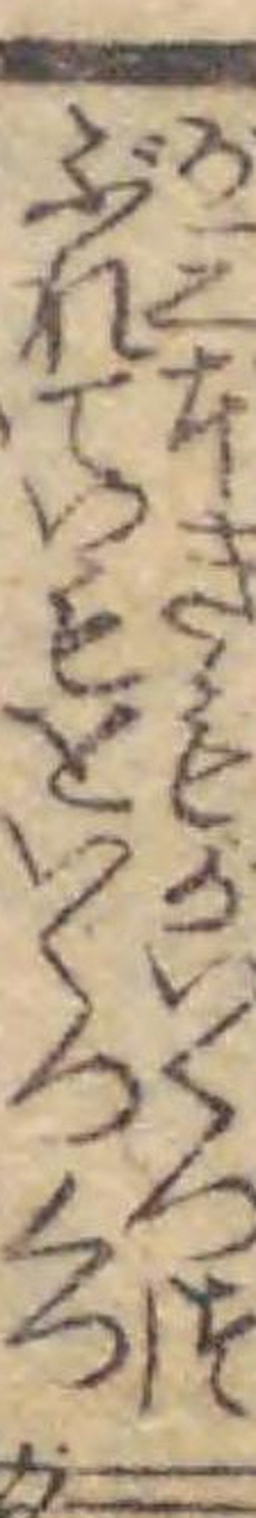ぶれていもをいくつくつ
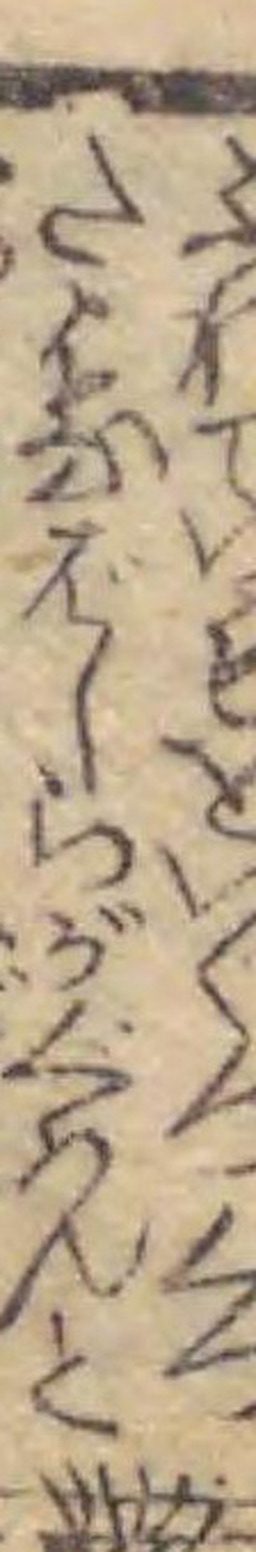たはなばしらがぐはんと
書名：十四傾城腹之内 : 3巻
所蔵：国立国会図書館 National Diet Library, JAPAN
